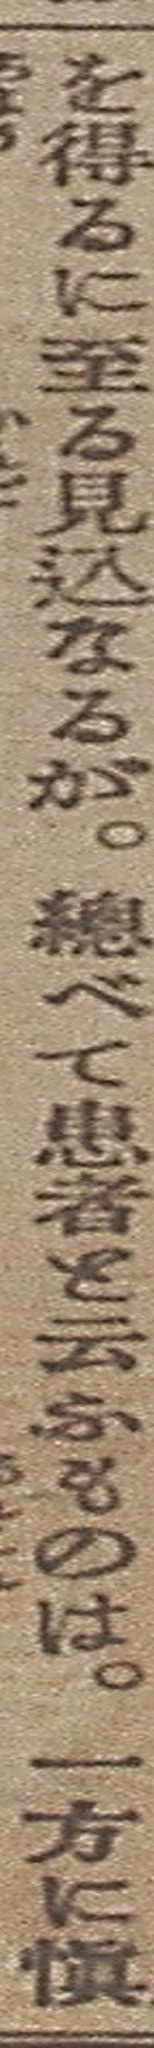を得るに至る見込なるが。総べて患者と云ふものは。一方に慎
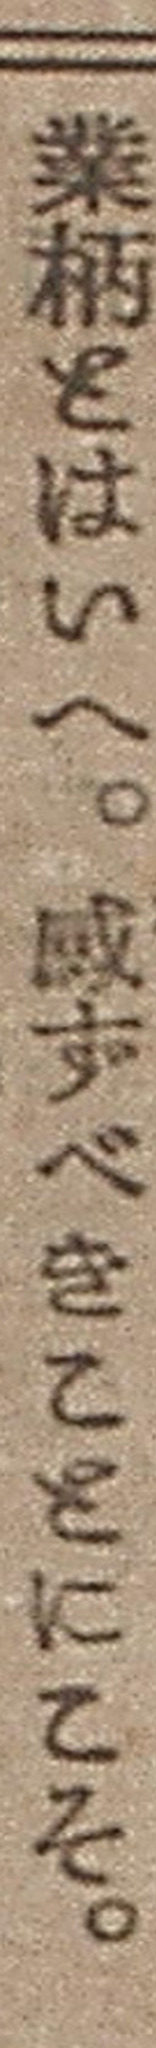業柄とはいへ。感ずべきことにこそ。
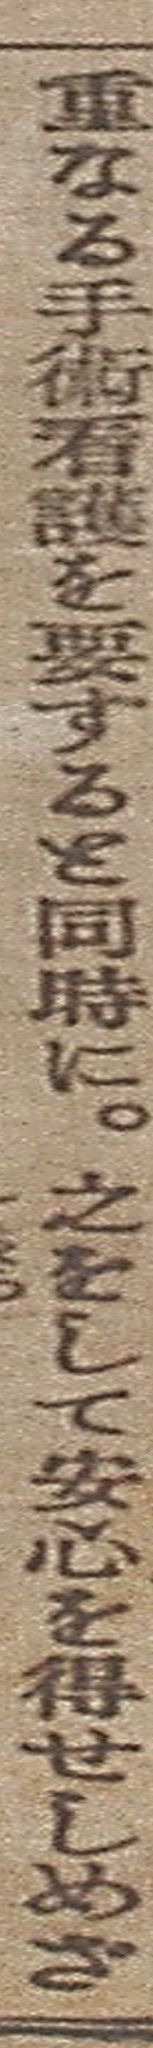重なる手術看護を要すると同時に。之をして安心を得せしめざ
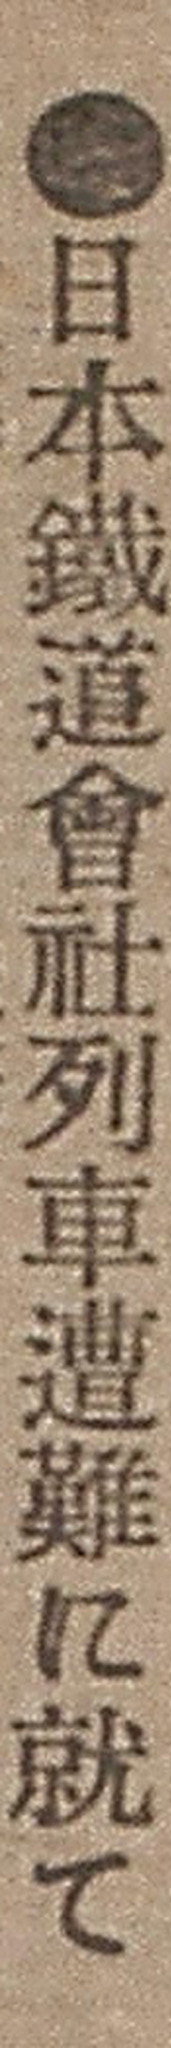●日本鉄道会社列車遭難に就て
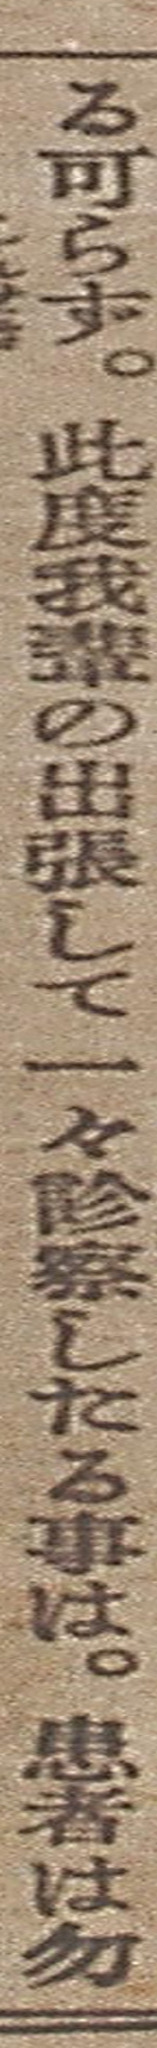る可らず。此度我輩の出張して一々診察したる事は。患者は勿
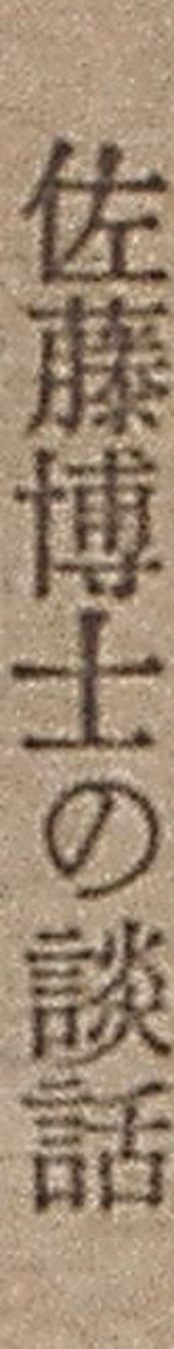佐藤博士の談話
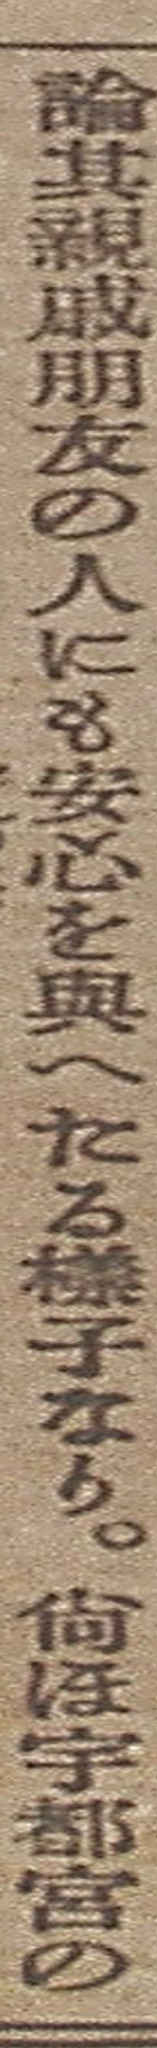論其親戚朋友の人にも安心を與へたる様子なり。尚ほ宇都宮の
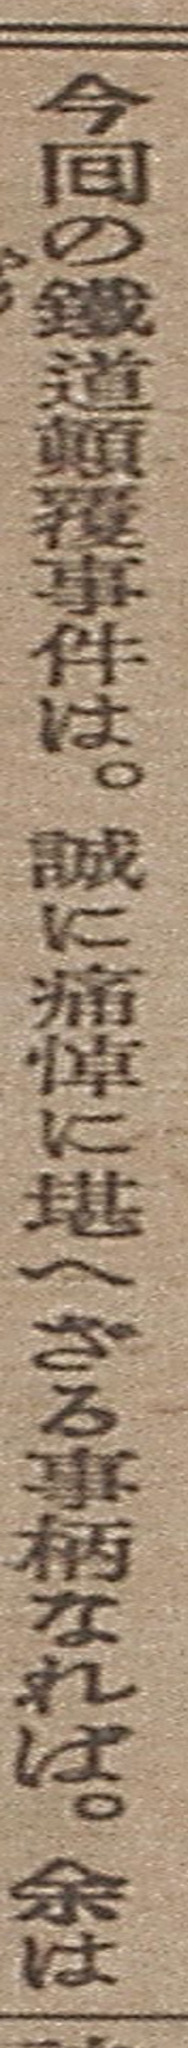今回の鉄道顛覆事件は。誠に痛悼に堪へざる事柄なれば。余は
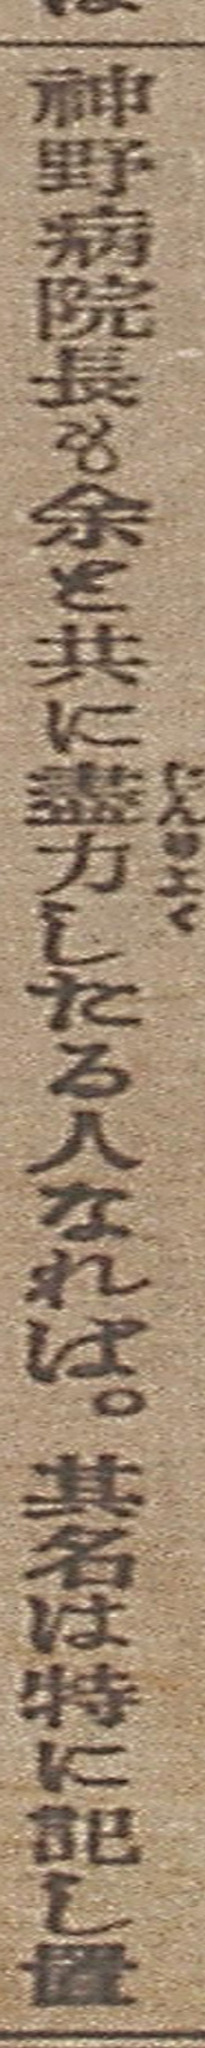神野病院長も余と共に尽力したる人なれば。其名は特に記し置
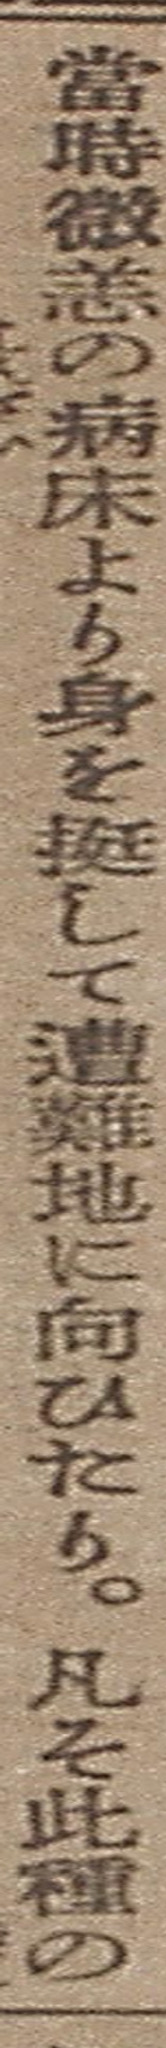当時微恙の病床より身を挺して遭難地に向ひたり。凡そ此種の
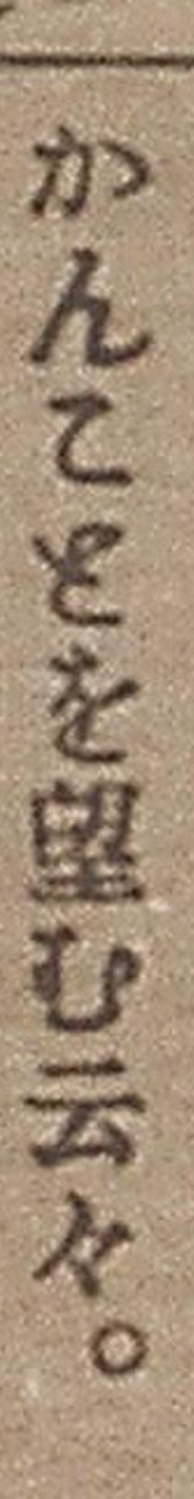かんことを望む云々。
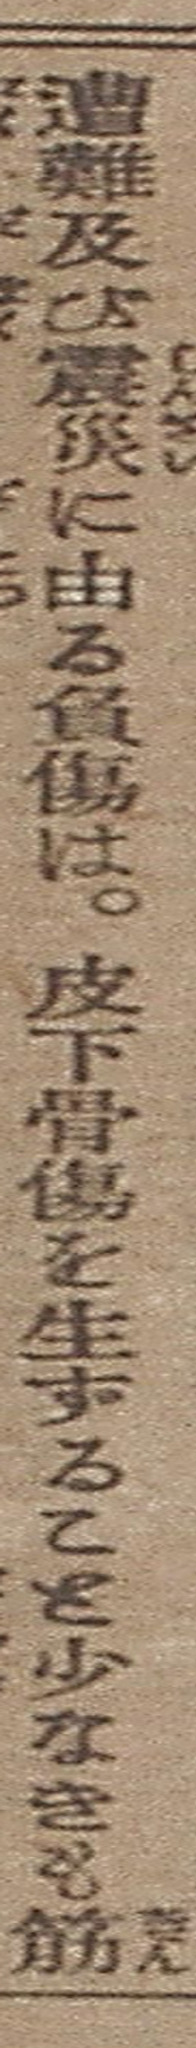遭難及び震災に由る負傷は。皮下骨傷を生ずること少なきも筋
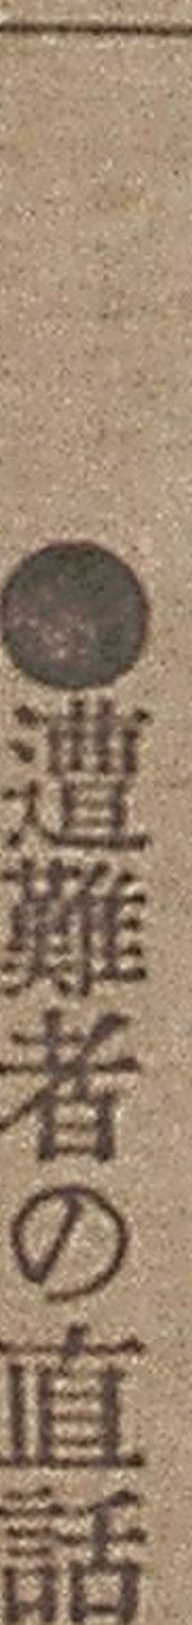●遭難者の直話
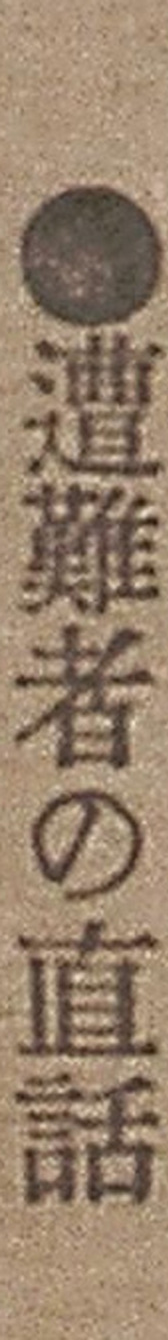●遭難者の直話
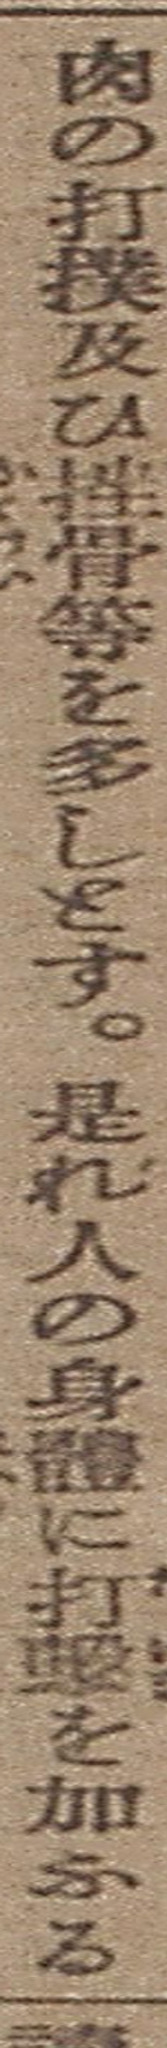肉の打撲及ひ挫骨等を多しとす。是れ人の身体に打撃を加ふる
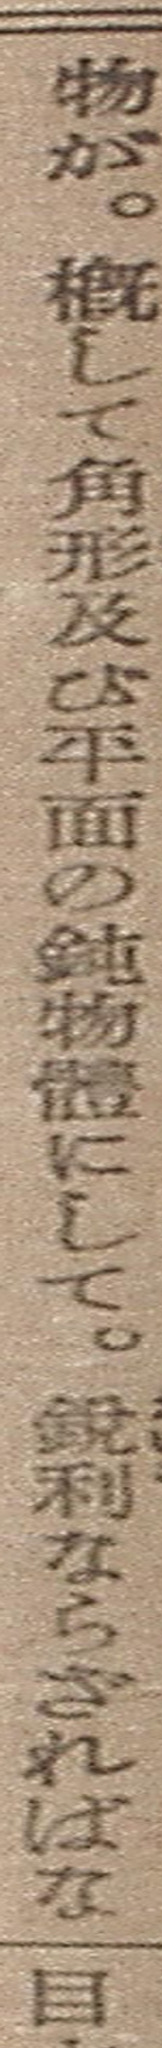物が。概して角形及び平面の鈍物体にして。鋭利ならざればな
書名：風俗畫報臨時増刊第百九十九號　明治三十二年十月各地災害圖會（前編之續）
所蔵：東京大学地震研究所図書室 Earthquake Research Institute Library, The University of Tokyo, JAPAN
